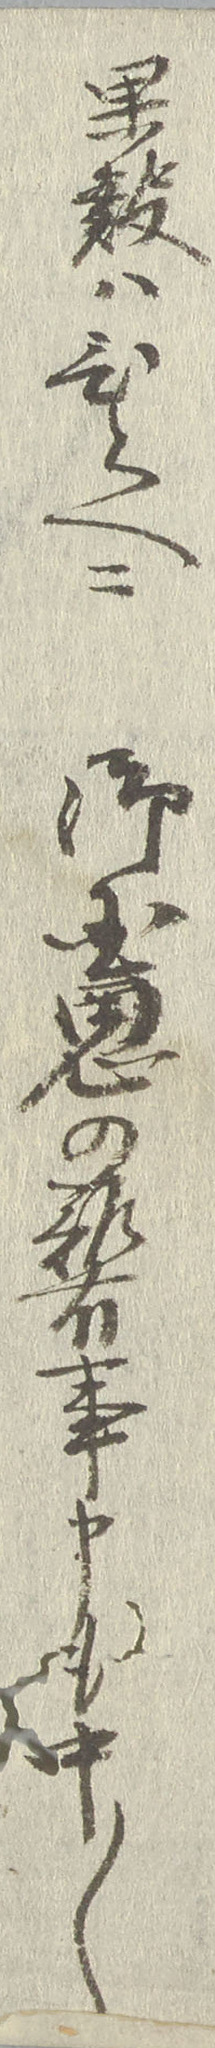果報ハひとへニ御國恩の難有事申も中〳〵
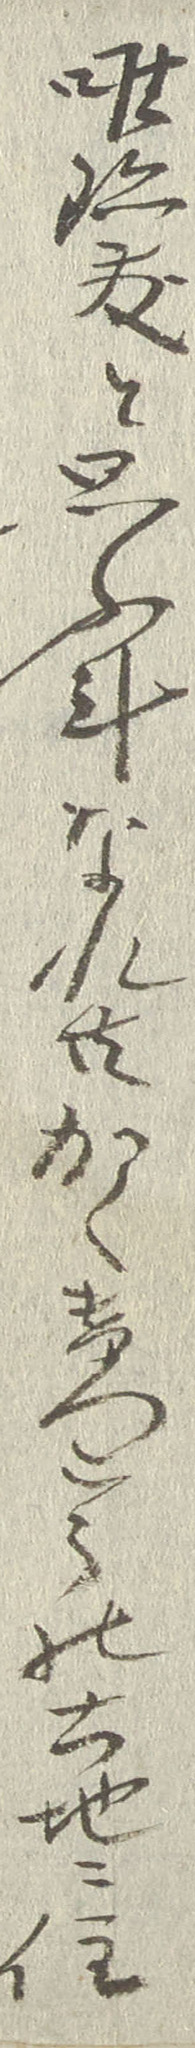唯珍しくと思ふ斗なれ共かくけつこうの土地ニ住
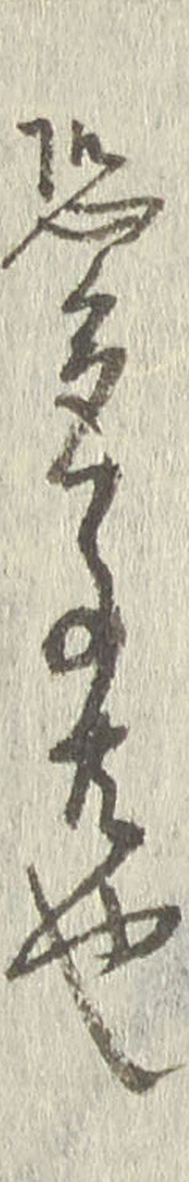恐多事共也
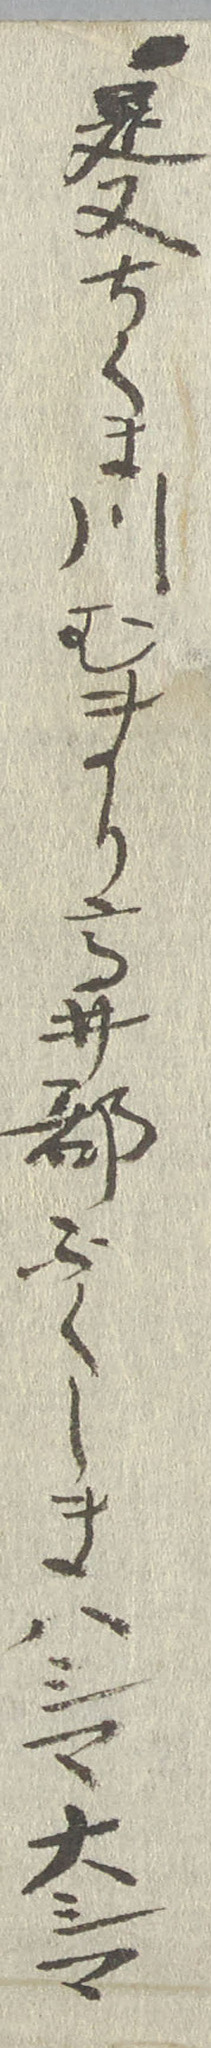●是又ちくま川むまり高井郡ふくしまハシマ大シマ
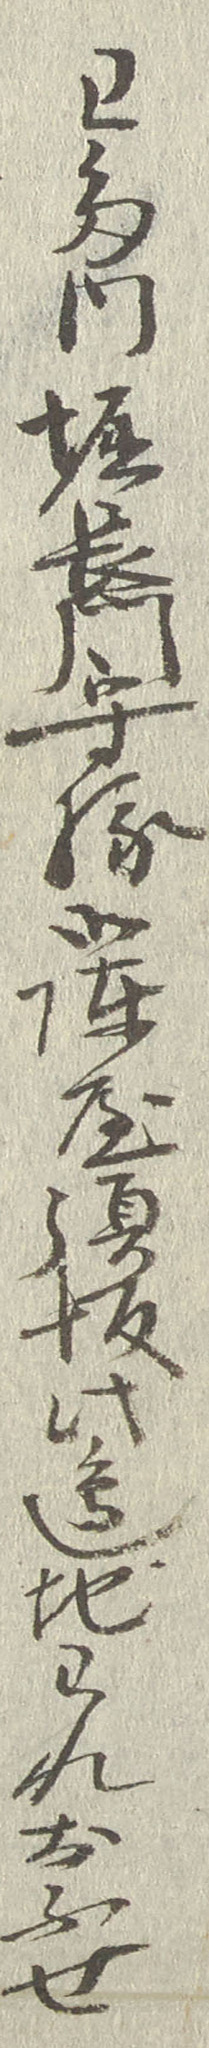わた内堀長門守様御陣屋須坂此邊地王れおふせ
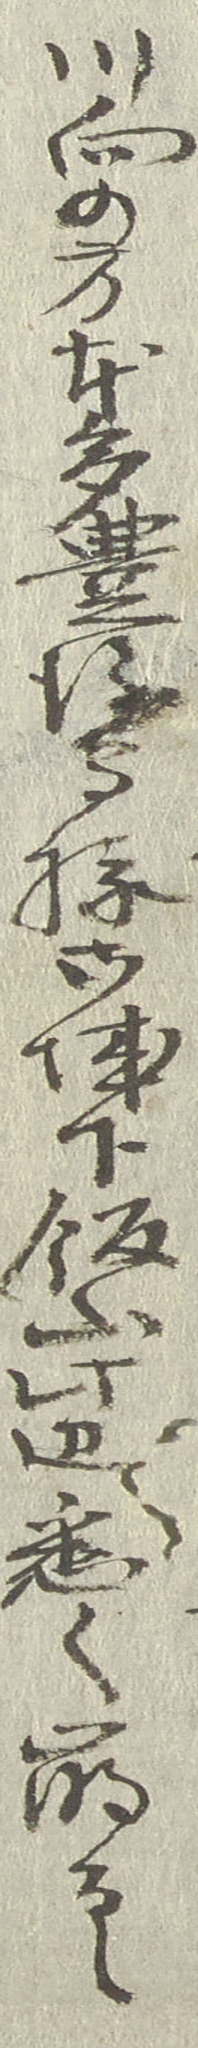川向の方本多豊後守様御城下飯山此辺悉く崩るゝ
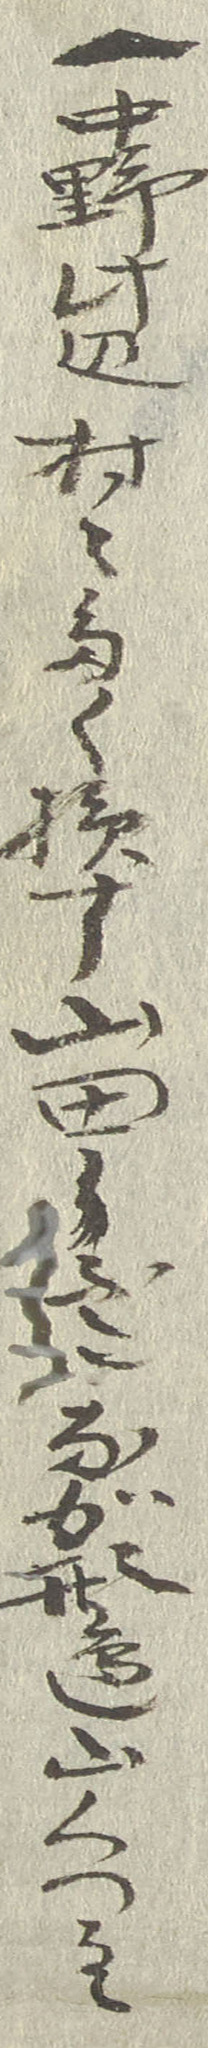▲中野此辺村々多く損す山田ふたなが形邊山くつるゝ
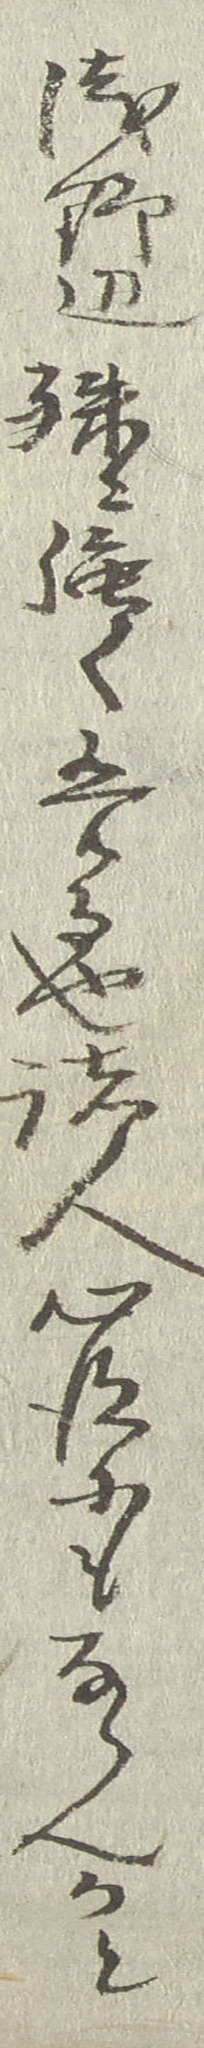浅野辺殊ニ強く有る事也諸人心得にもならんかと
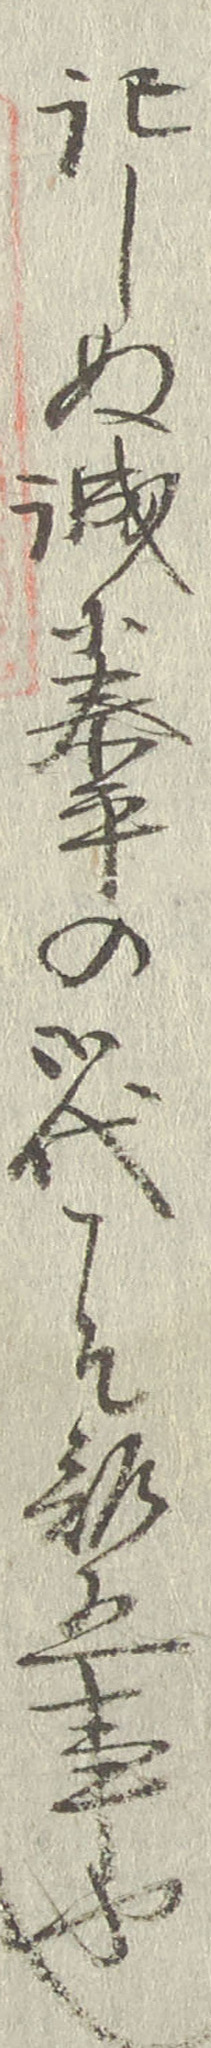記しぬ誠に泰平の御代こそ難有事也
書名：[善光寺地震摺物写]
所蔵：東京大学総合図書館 General Library in the University of Tokyo, JAPAN
